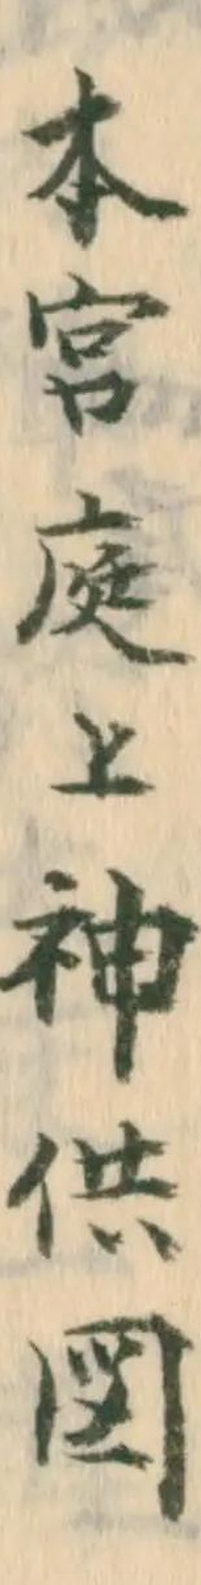本宮庭上神供図
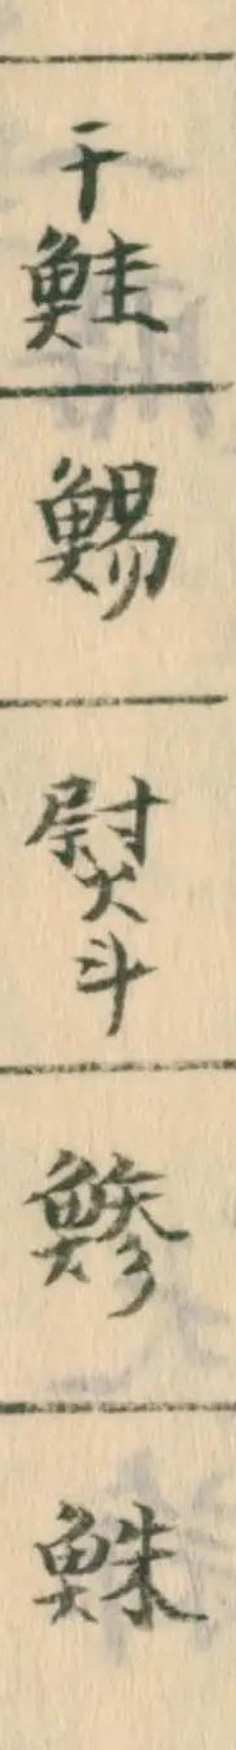干鯉鯣熨斗鯵鮢
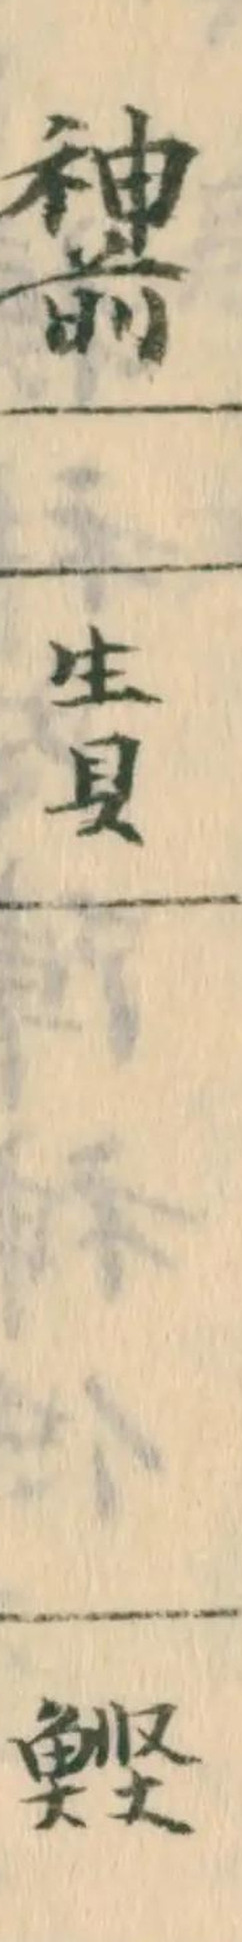神前生貝鰹
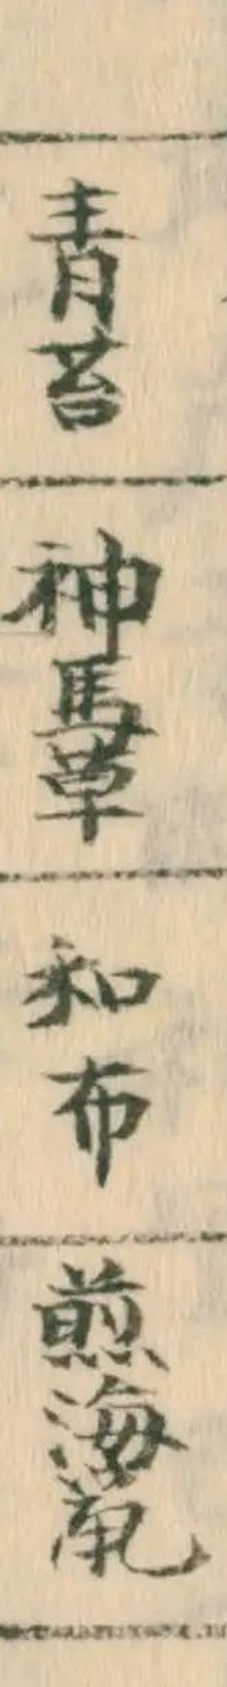塩青苔神馬草和布煎海鼠
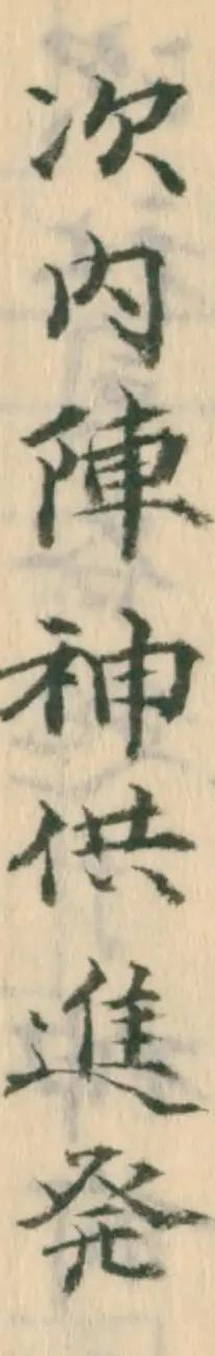次内陣神供進発
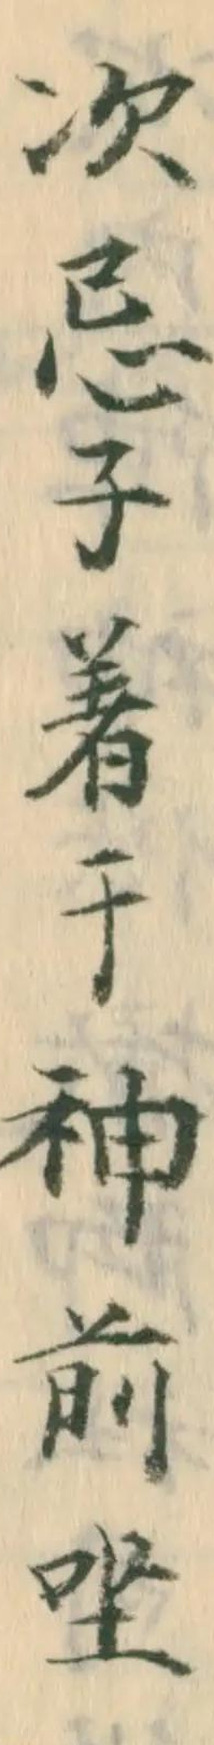次忌子着于神前坐
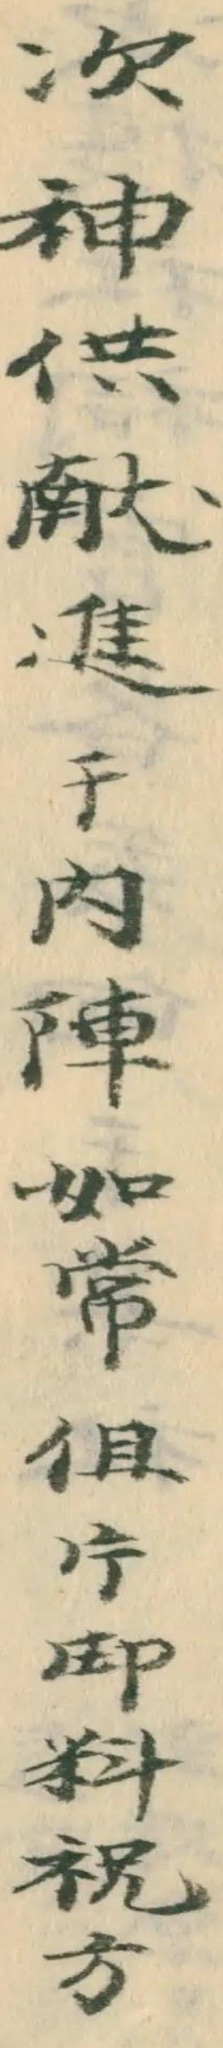次神供献進于内陣如常但片御料祝方

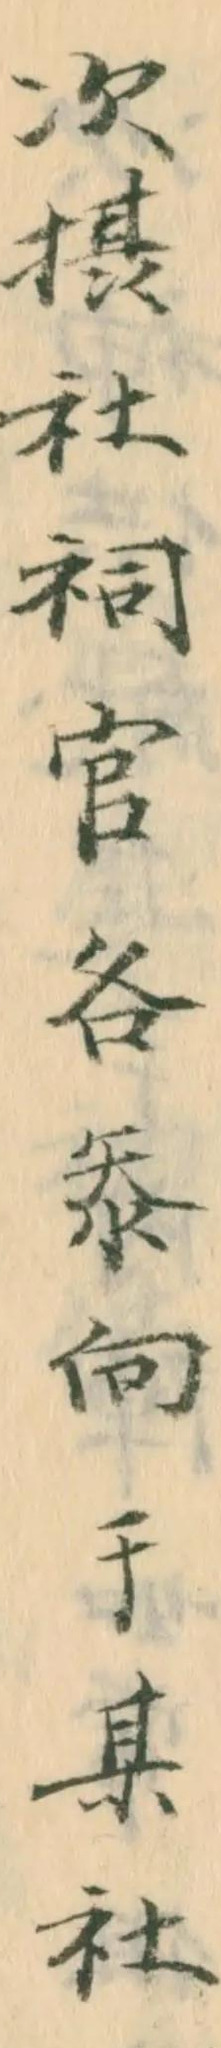次摂社祠官各参向于某社
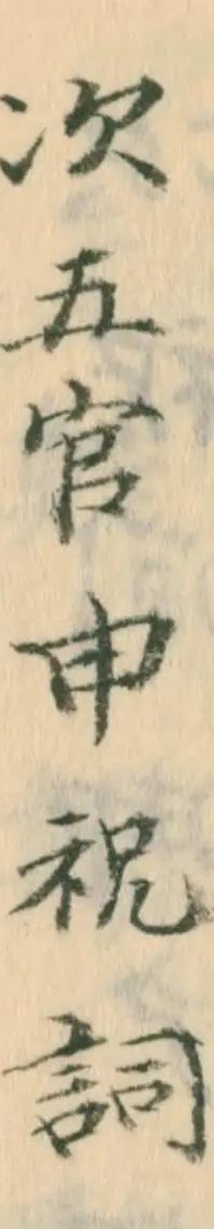次五宮申祝詞
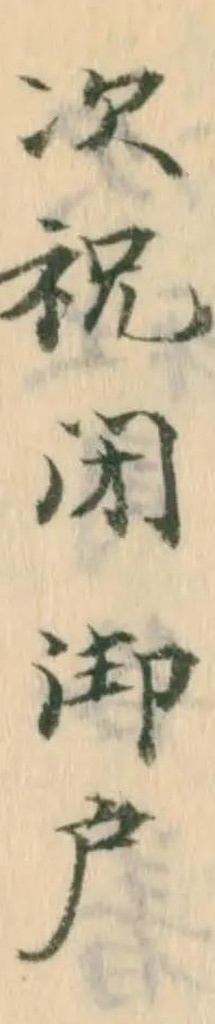次祝閉御戸
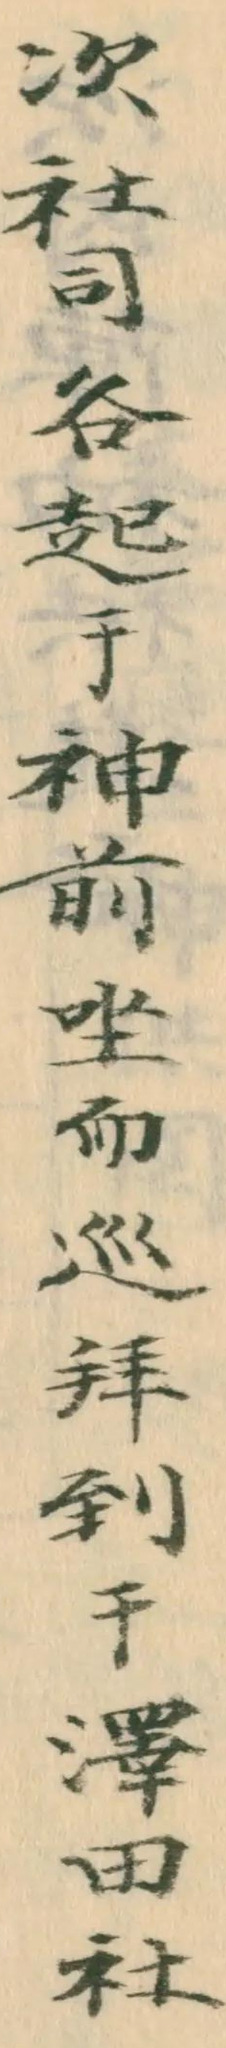次社司各起于神前坐而巡拝到于沢田社
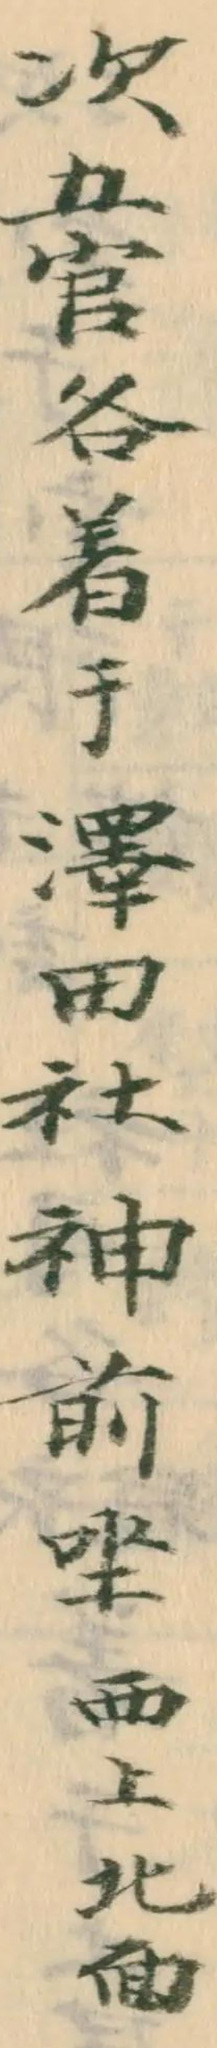次五官各着于沢田社神前坐西上北面
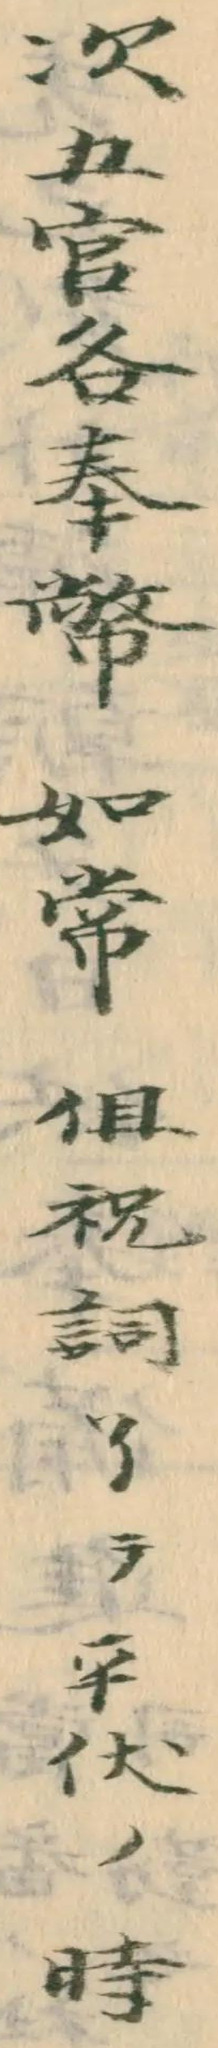次五官各奉幣如常但祝詞了テ平伏ノ時
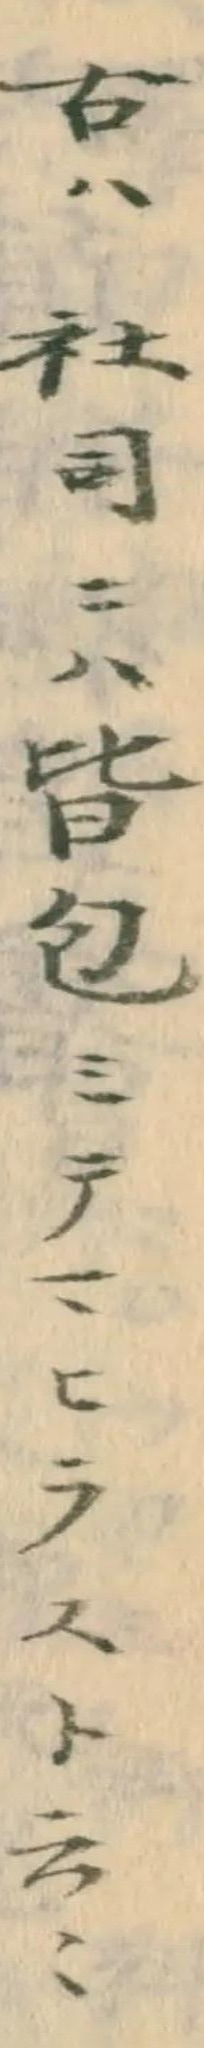古ハ社司ニハ皆包ミテマヒラスト云々
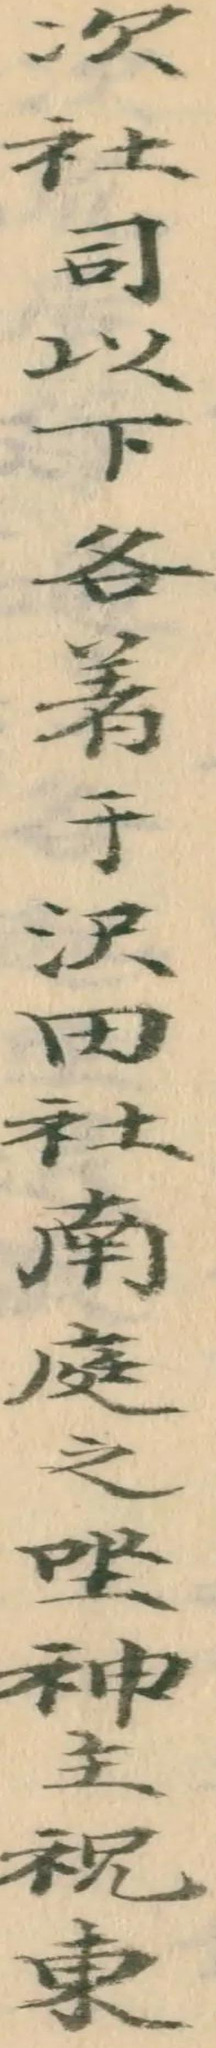次社司以下各着于沢田社南庭之坐神主祝東
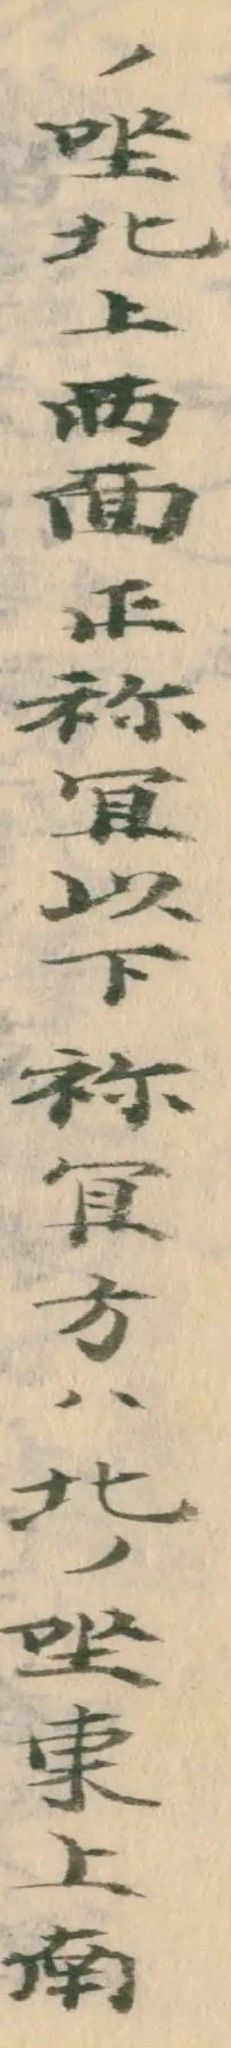ノ坐北上西面正禰宜以下禰宜方ハ北ノ坐東上南
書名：賀茂社記録. 第5冊
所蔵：国立国会図書館 National Diet Library, JAPAN
